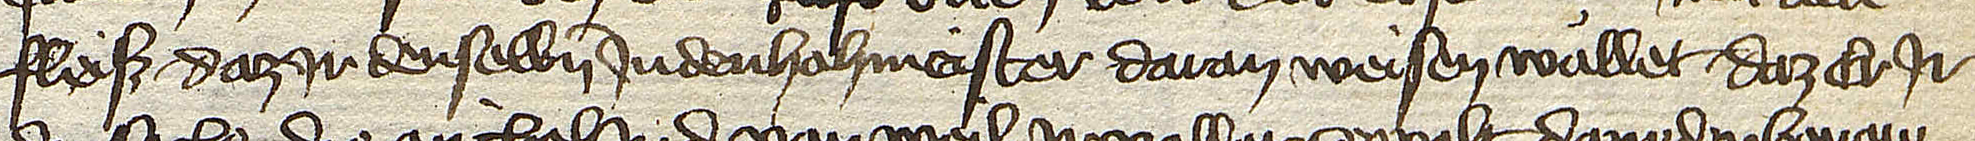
fleiſʒ / daʒ Ir denſelbn* Iudenhohmeiſter daran weiſen wöllet / daʒ Er Ir
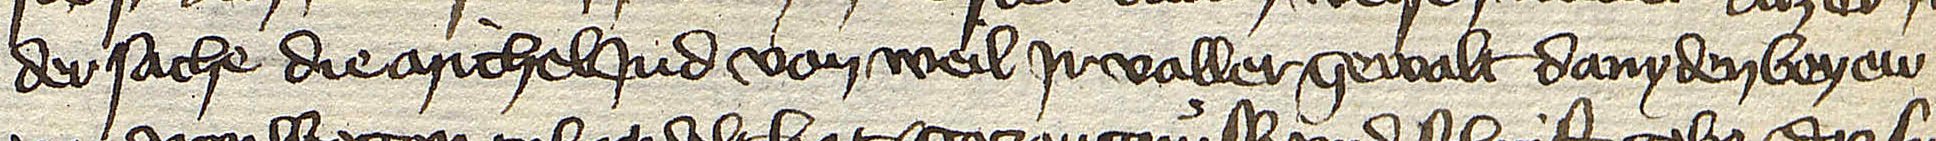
der ſache die Michel Iud von weil Ir voller gewalt danyden bey ew
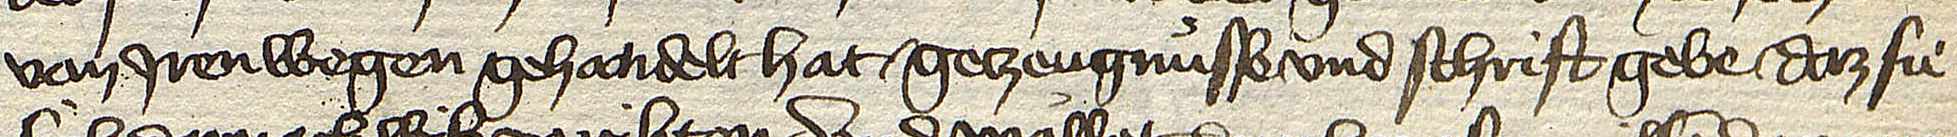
von Iren wegen gehandelt hat / gecʒeugnüſſe vnd ſchrift gebe / daʒ ſie
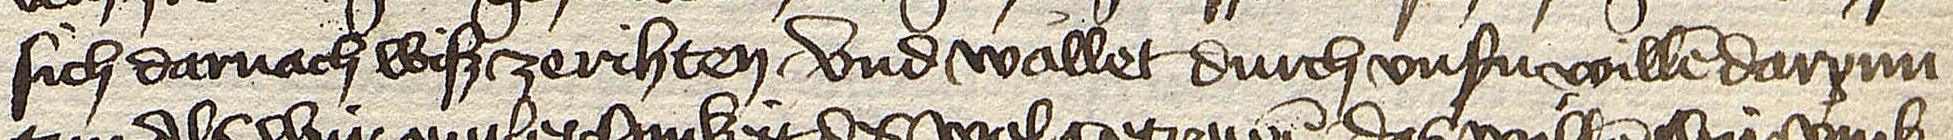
ſich darnach wiſʒ cʒerihten / vnd wöllet durch vnſ*n wille* darynn
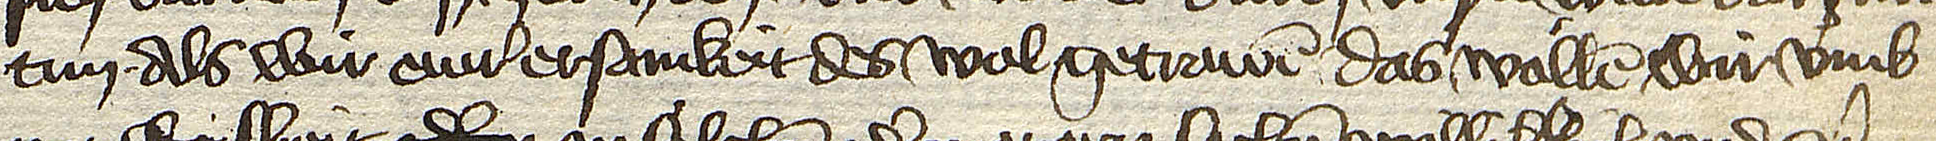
tun . Als wir ewr* erſamkeit des wol getrawe* das wölle* wir v̈mb
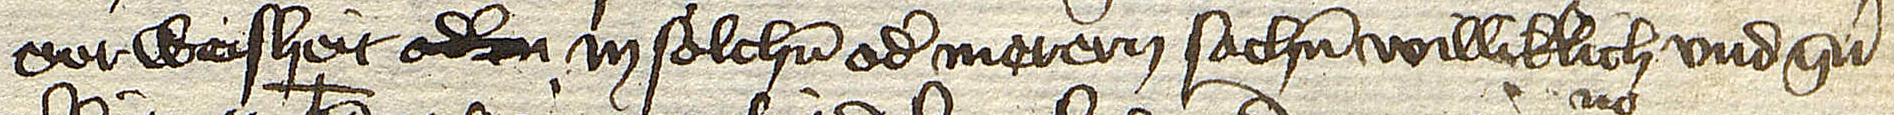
ewr weiſheit od* in in ſölchn* od* merern ſachn* williklich vnd gn*
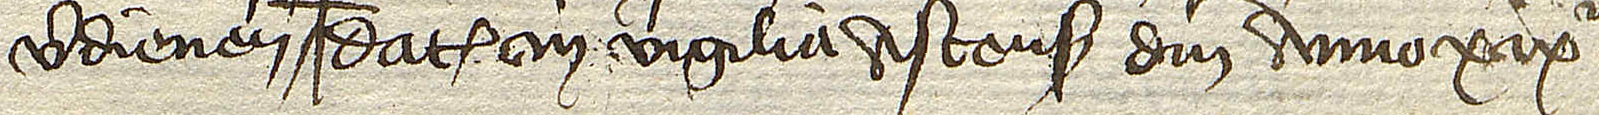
v*dienen dat* in vigilia Aſcenſ* dm* Anno xix*
